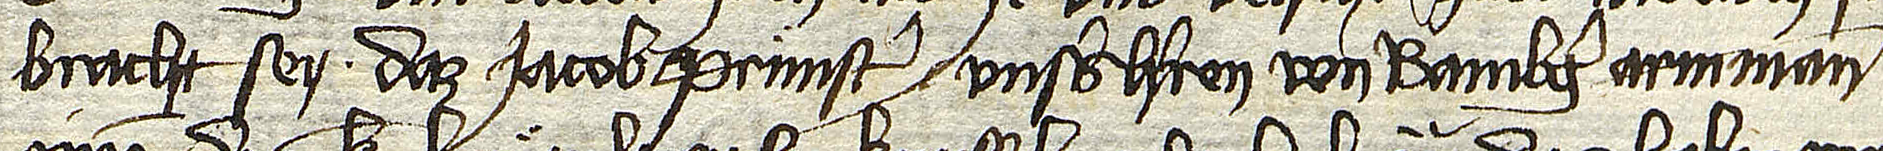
bracht ſey . daʒ Iacob Prünſt* vnſ*s h*ren von Bamb*g armman*
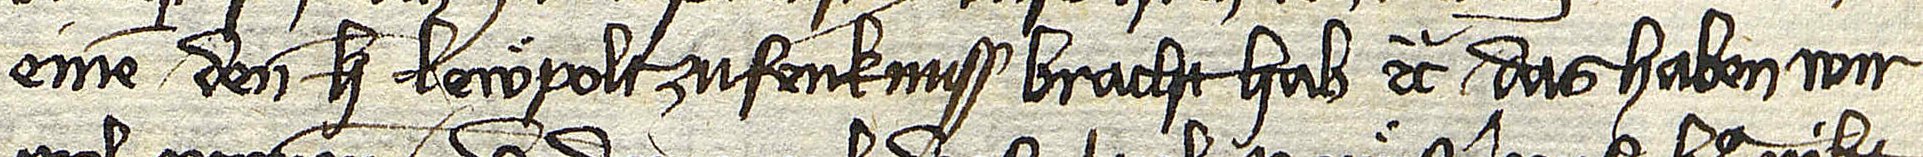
eine* / den H* lewpolt ʒufenknuſſ bracht hab ec* / das haben wir
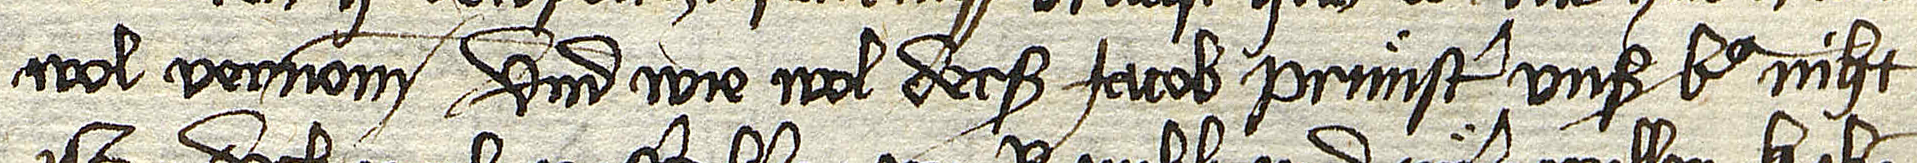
wol vernom* / Vnd wie wol verſ* Iacob Prünſt* vnſ* b* niht
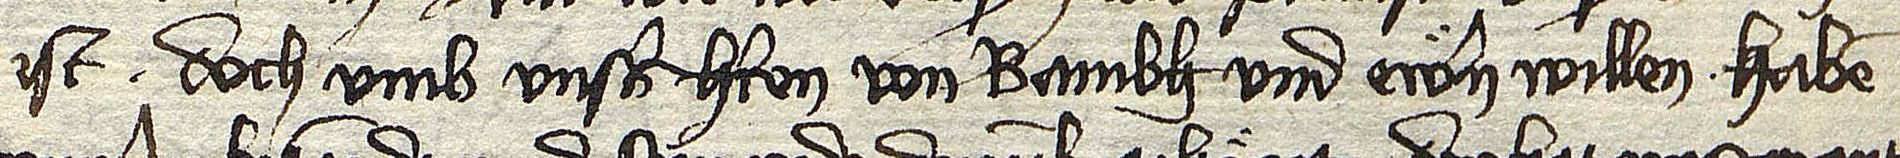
iſt . Doch vmb vnſ*s h*ren von Bamb*g vnd ew*n willen . habe*
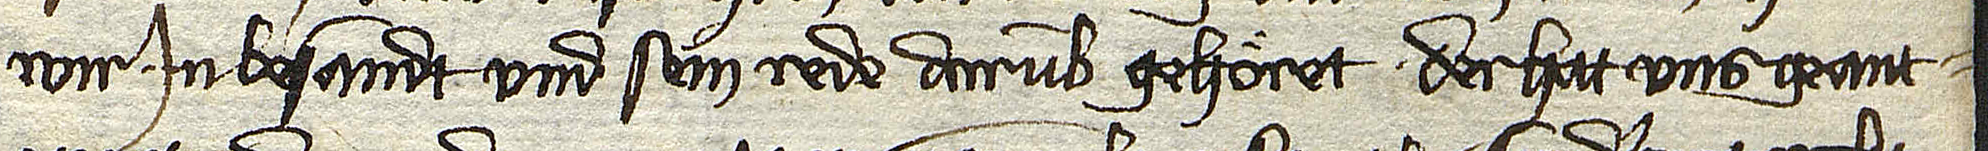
wir In beſandt vnd ſein rede darub* gehöret . der hat vns geant =
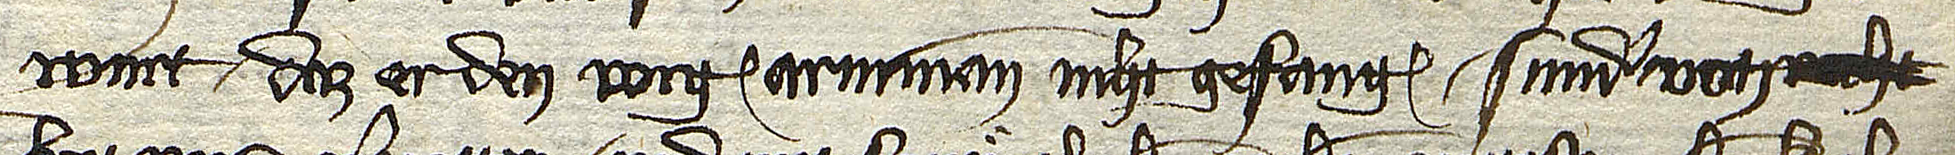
wurt / daʒ er den vorg* armman* niht gefang* / ſund* von recht
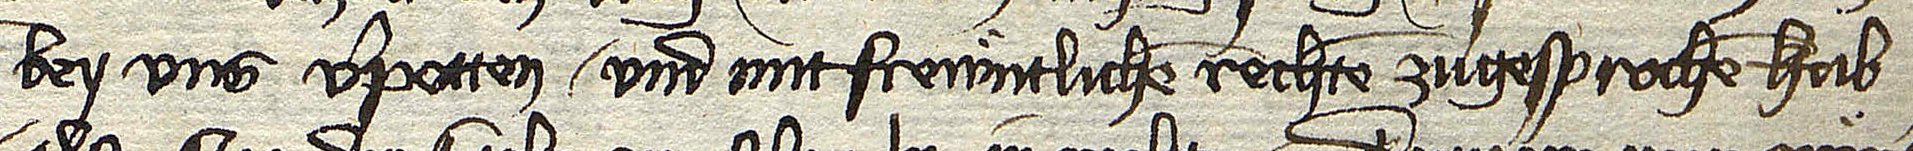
bey vns v*potten / vnd mit frewntliche* rechte* ʒugeſproche* hab
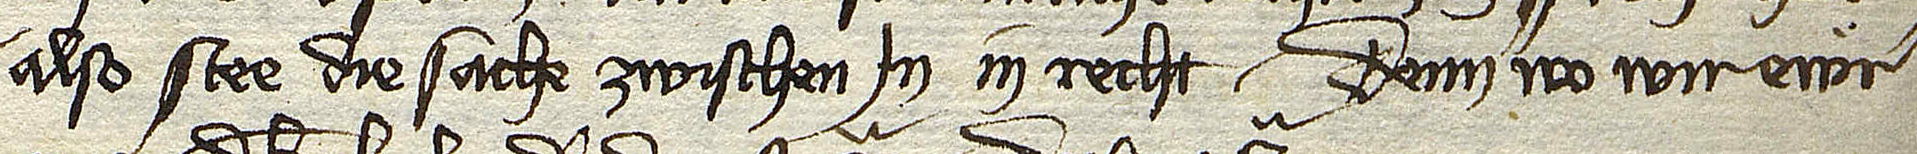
alſo ſtee die ſache ʒwiſchen In in recht / Denn wo wir ew*r
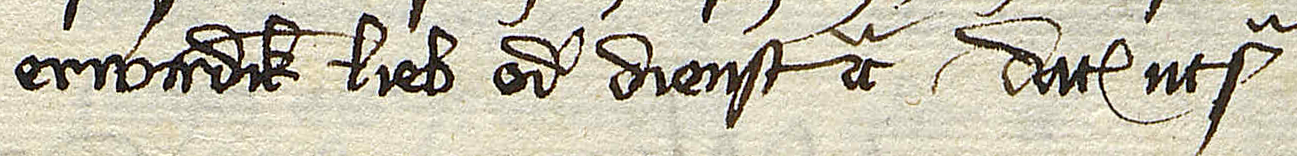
erwirdik* lieb od* dienſt ec* / Dat* ut ſ*
